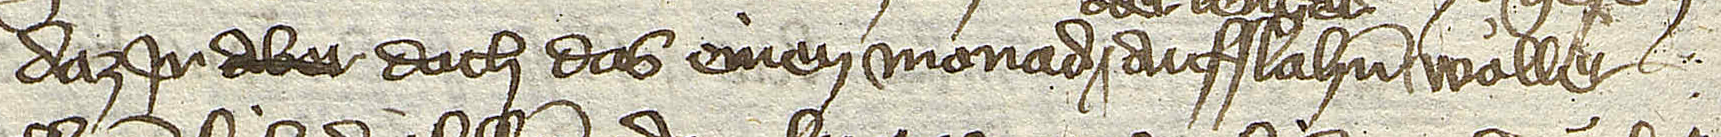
daʒ Ir Aber doch das einen monad Aufſlahn* wöllet
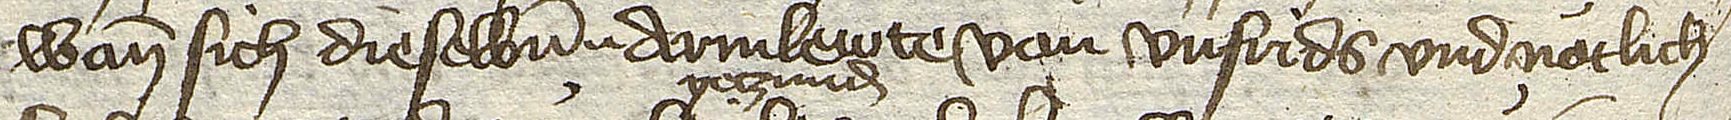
wan* ſich dieſelbn* ~ Armlewte von vnfrids vnd nötlich*
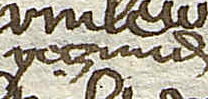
yecʒund*
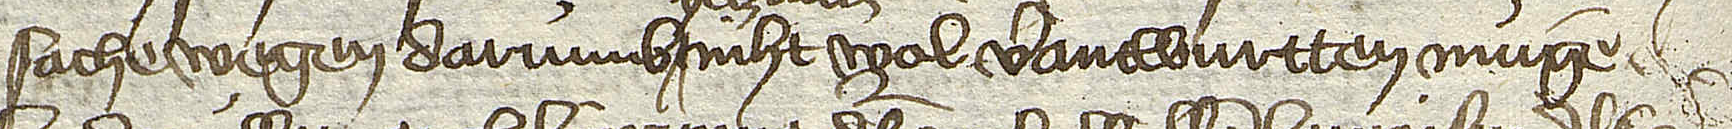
ſache wegen darümb niht wol v*antwurtten müge*
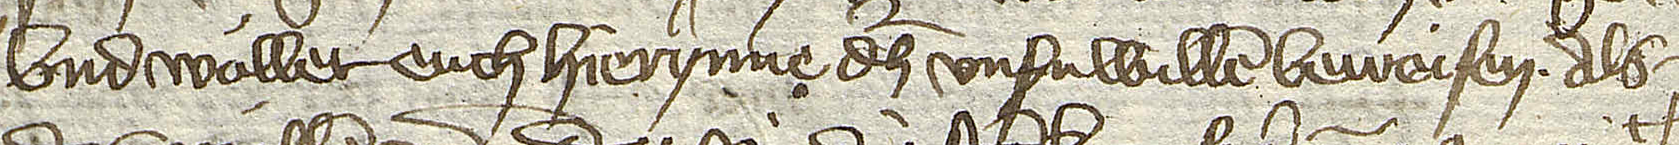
vnd wöllet euch hierynne d*h vnſ*n wille* beweiſen . Als ec*
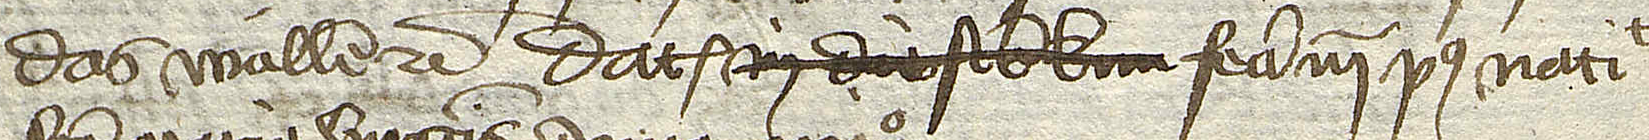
das wölle* ec* Dat* in die ſce* kun fea* iii* p* nati*
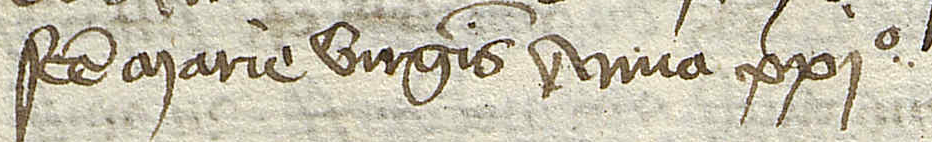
ſce* Marie virgis* Anno xxi*
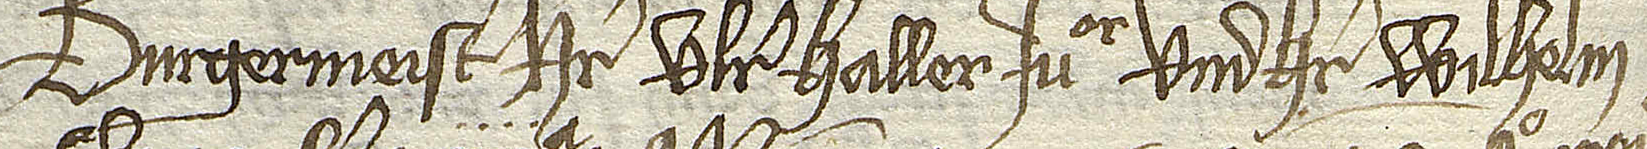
Burgermeiſt* Hr* Vlr* Haller Iu* Vnd Hr* Wilhlem
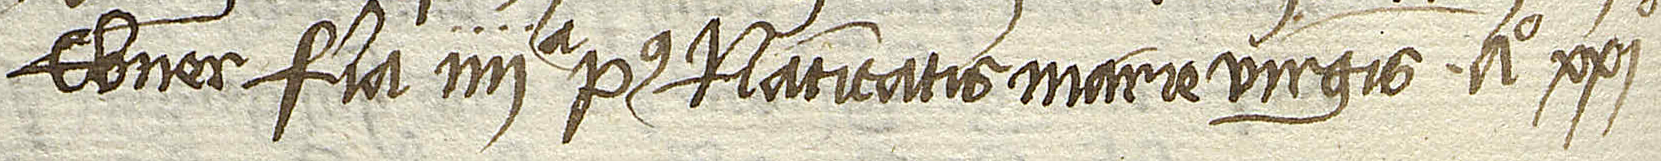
Ebner fi*a iiii* p* Natitatis* marie virgis* . A* xxi*
